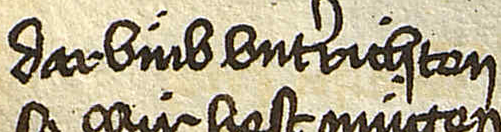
darv̈mb vnt*richten
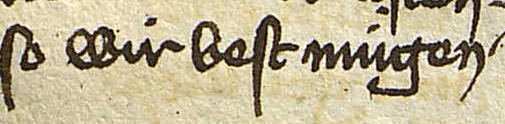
ſo wir beſt mügen
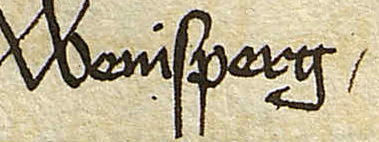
Weinſperg /
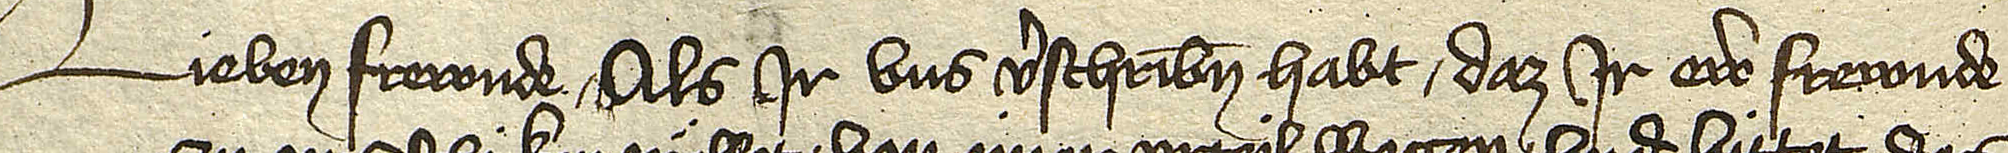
Lieben frewnde / Als Ir vns v*ſchribn* habt / daʒ Ir ew* frewnde
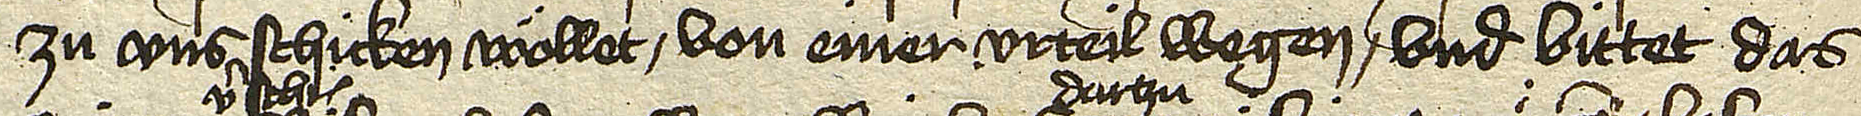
cʒu vns ſchicken wöllet / von einer vrteil wegen / vnd bittet das
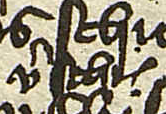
v*ſchr*
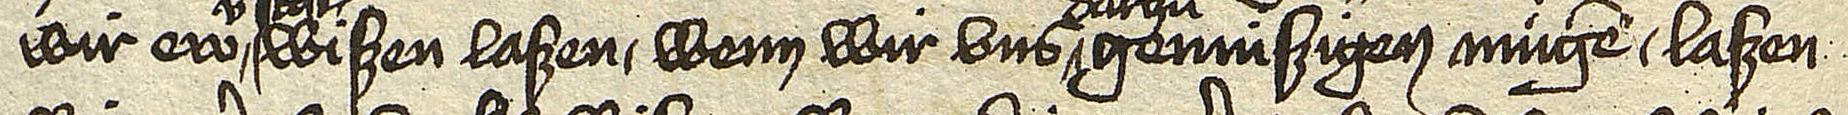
wir ew wiſʒen laſʒen / wenn wir vns gemüſʒigen müge* / laſʒen
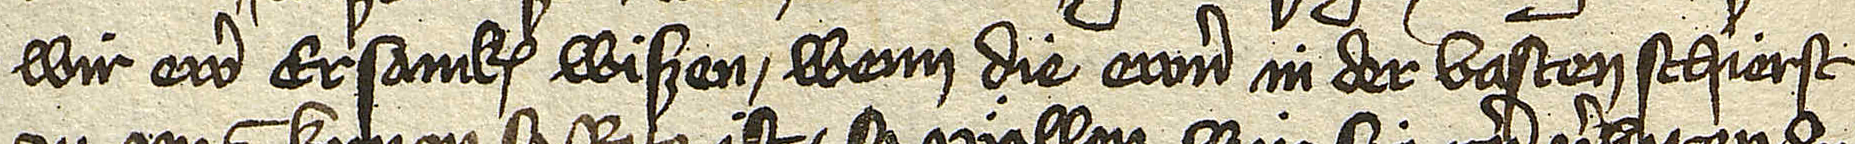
wir ew* Erſamk* wiſʒen / wenn die ewn* in der vaſten ſchierſt
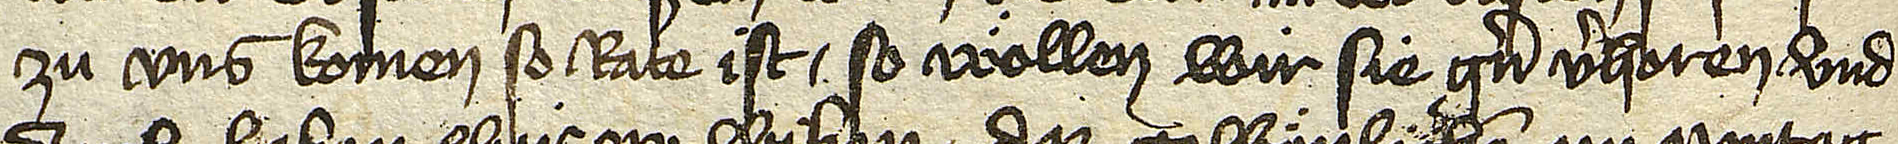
cʒu vns komen ſo Rate iſt / ſo wöllen wir ſie gn* v*horen / vnd
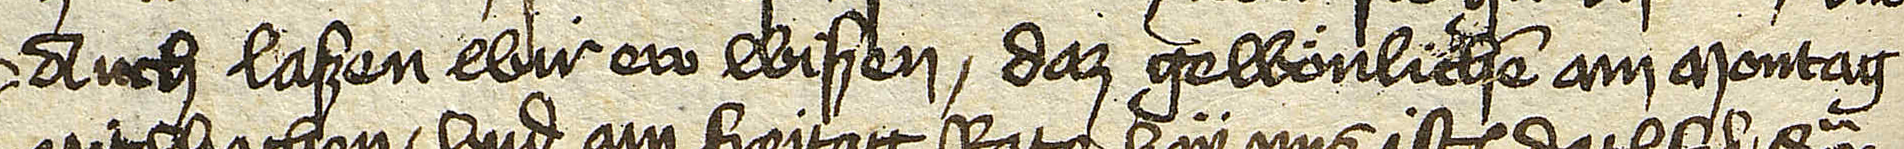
Auch laſʒen wir ew wiſʒen / daʒ gewönliche* am Montag
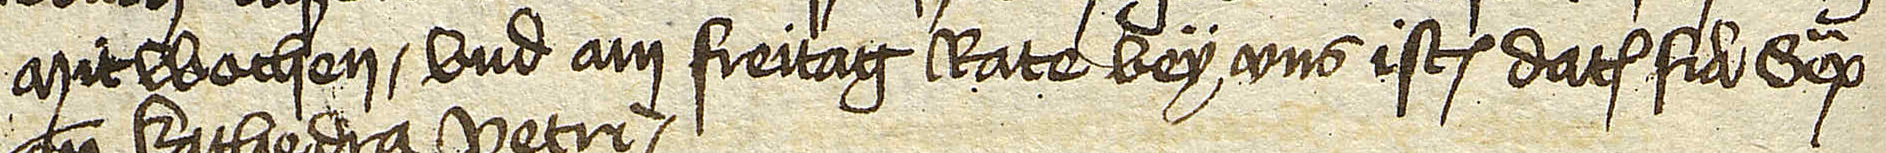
Mitwochen / vnd am freitag Rate bey vns iſt / dat* fia* Sex*
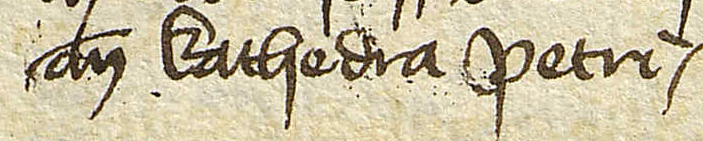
an* Kathedra Petri /
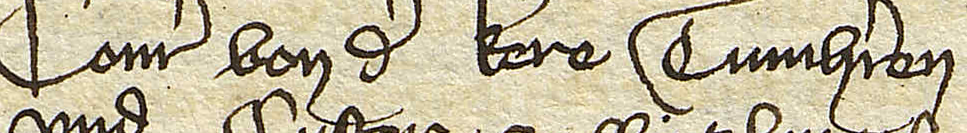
Conr* von d* Kere Tumh*ren
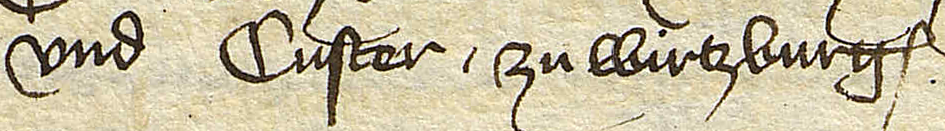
vnd Cuſter / cʒu wirtʒburg*
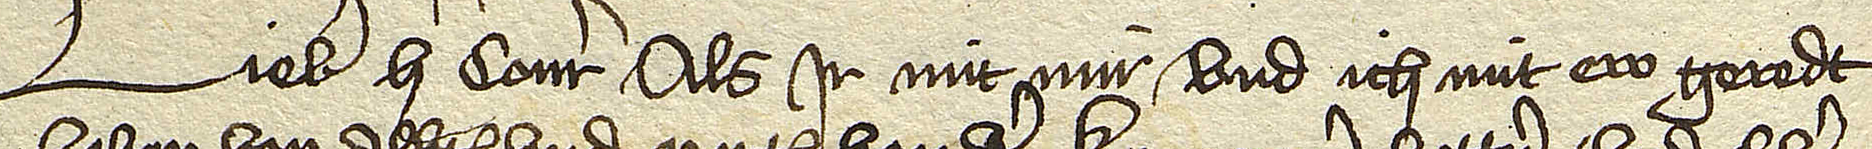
Lieb* h* Conr* / Als Ir mit mir / vnd ich mit ew geredt
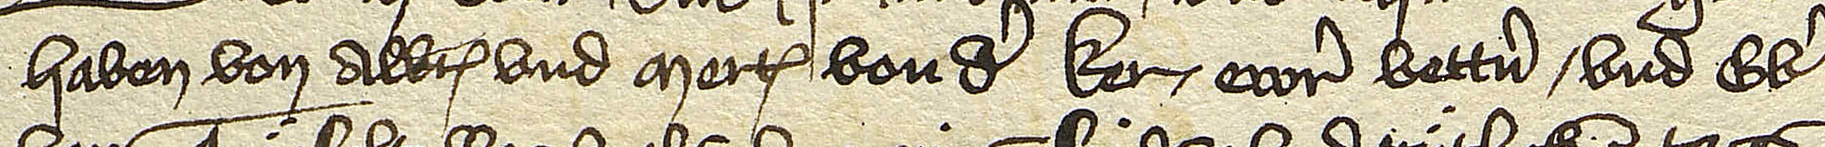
haben von Albr* vnd Mert* von d* Ker / ewr* vettn* / vnd Eb*
